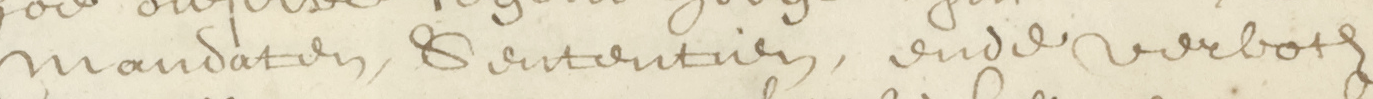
Mandaten, Sententien, ende Verboth,
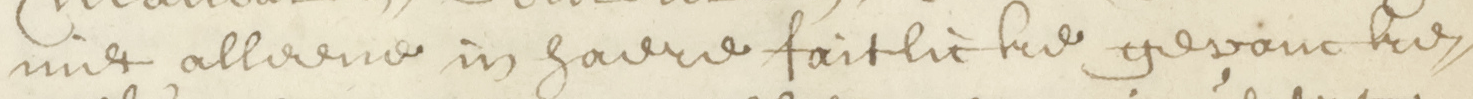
niet alleene in haere faitlicke gevancke„
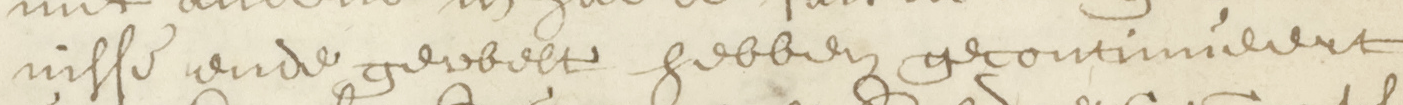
nisse ende gewelt hebben gecontinueert
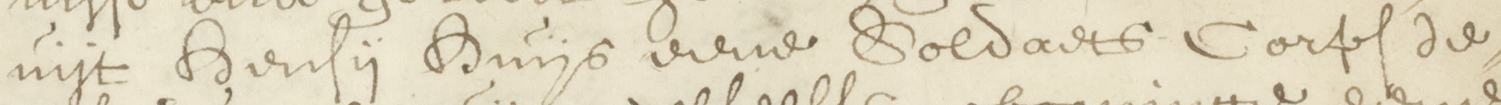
uijt Hensij Huijs eene Soldaets Corps de
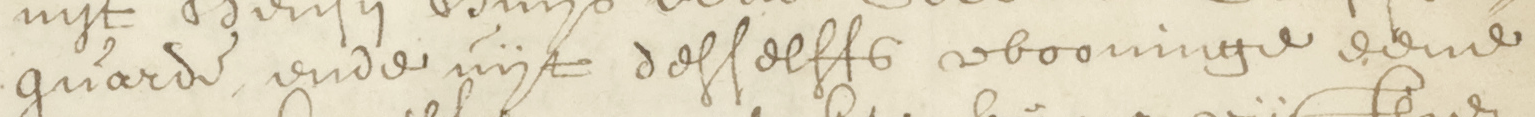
guarde, ende uijt desselffs wooninge eene
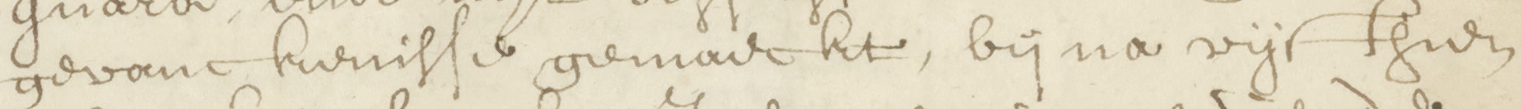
gevanckenisse gemaeckt, bij na vijfthien
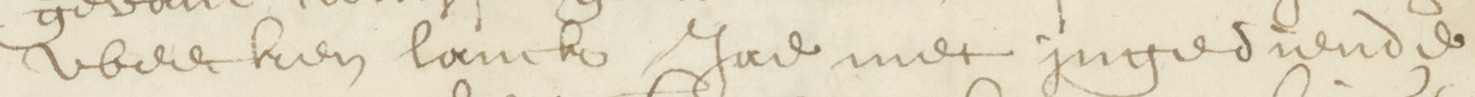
weecken lanck, Jae met ingediende
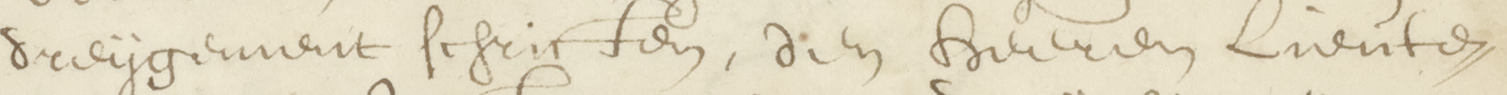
dreijgement schriften, den heeren Lieute„
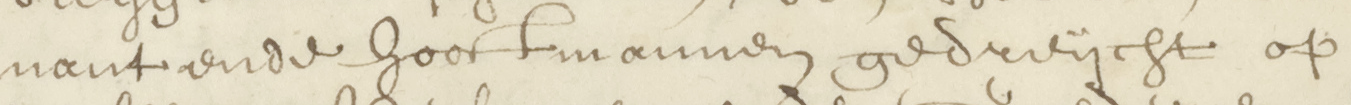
nant ende hooftmannen gedreijcht op
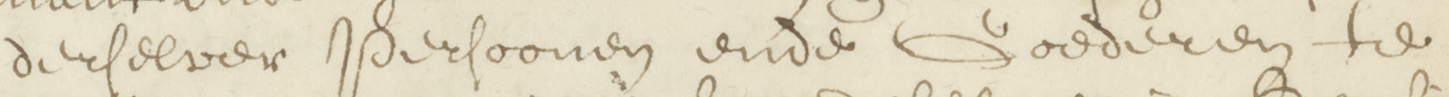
derselver Persoonen ende Goederen te
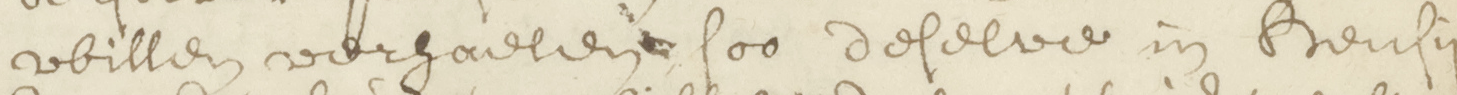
willen verhaelen soo deselve in Hensij
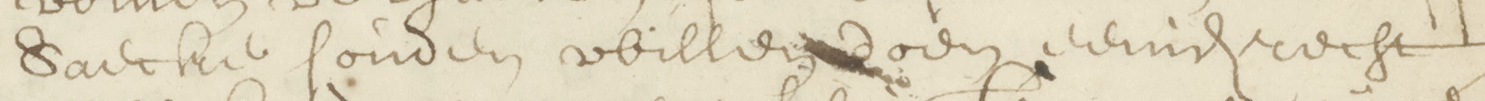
Saecke souden willen doen eenichrecht
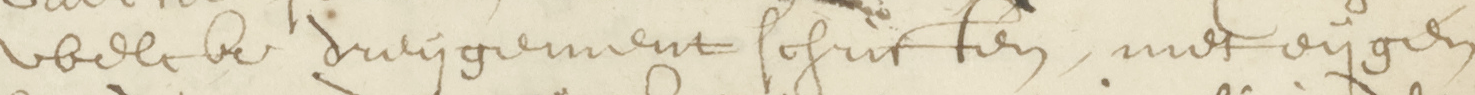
welck dreijgement schriften, met eijgen
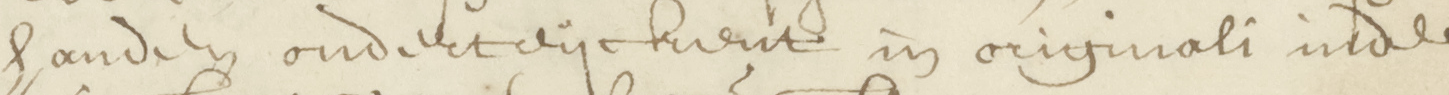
handen onderteijckent in originali inde
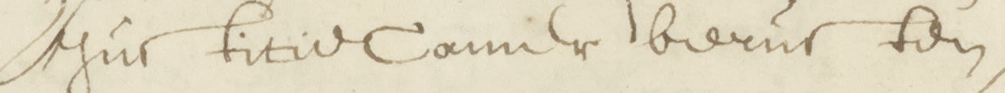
Justitie Camer berusten.
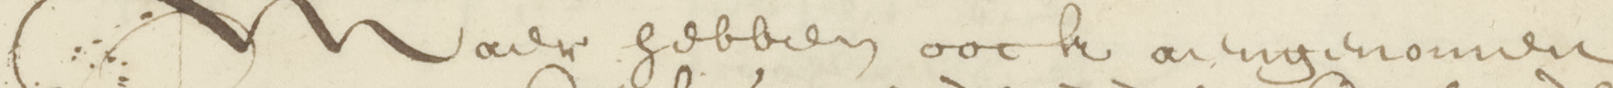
Waer hebben oock aengenomen
